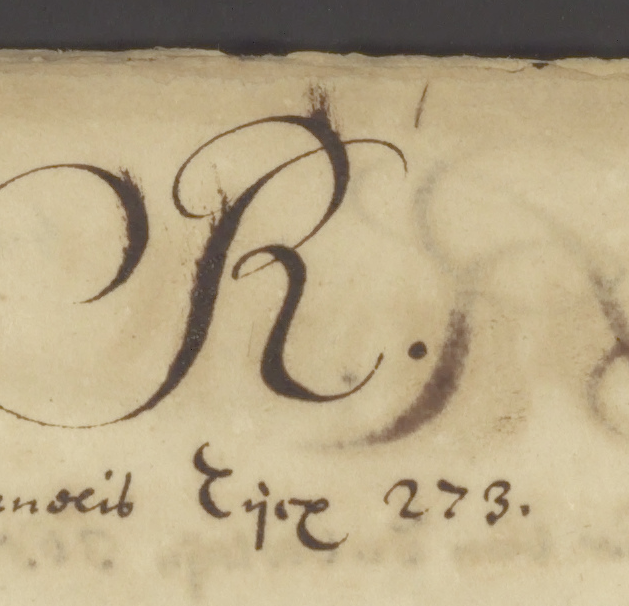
R.
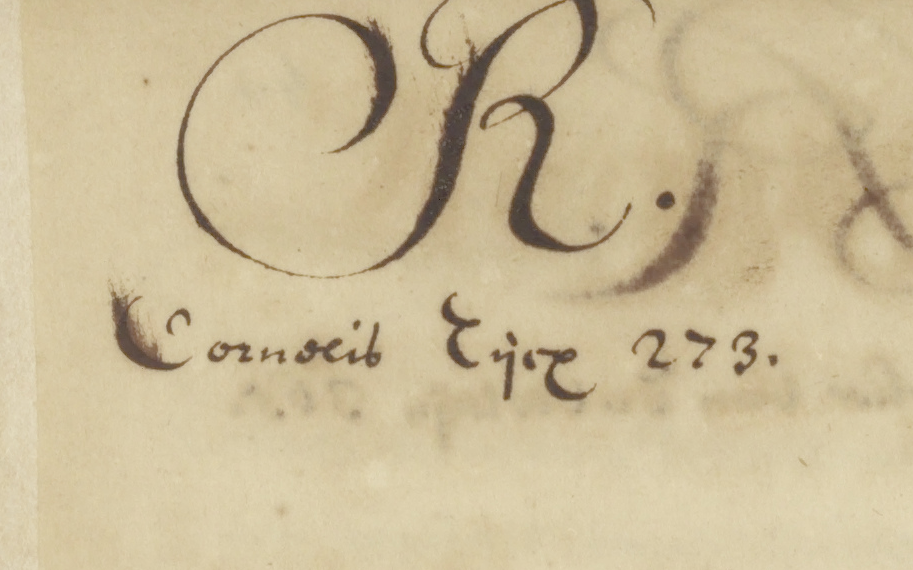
Cornelis Rijcx 273.
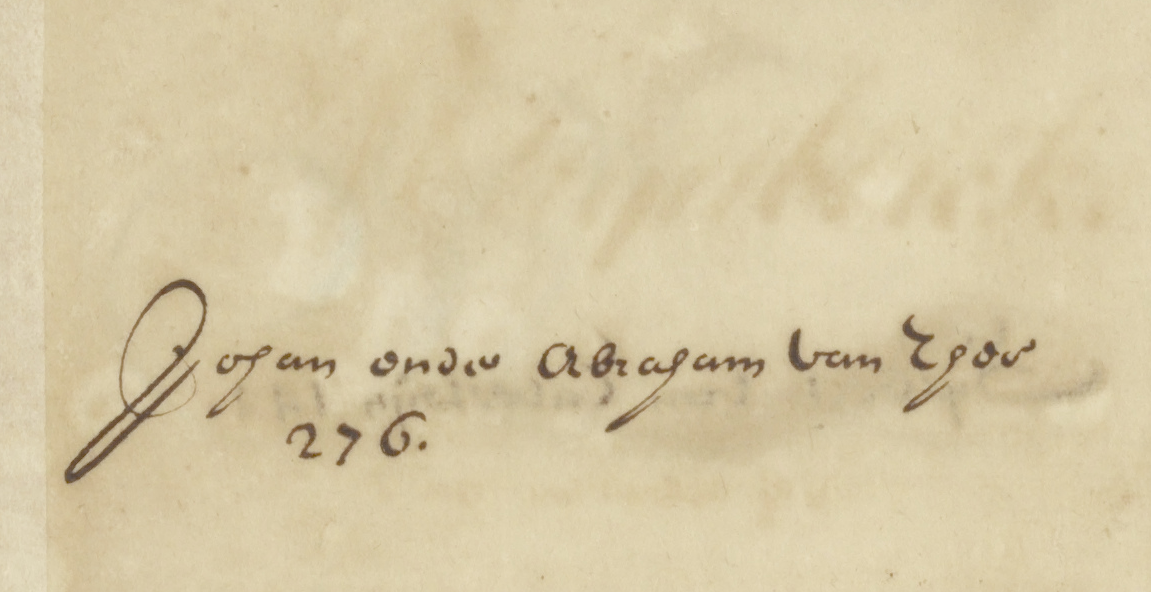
Johan ende Abraham van Rhee
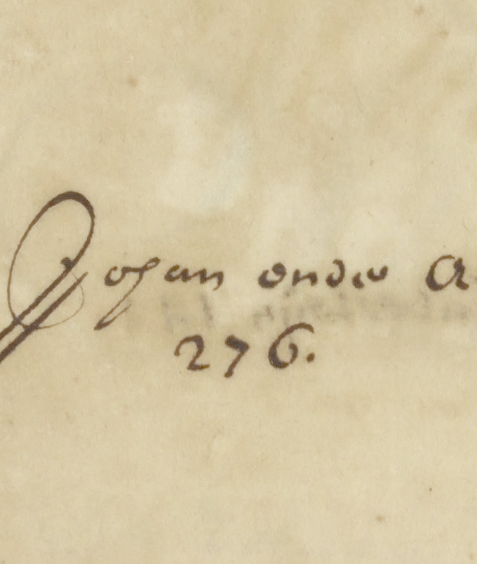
276.
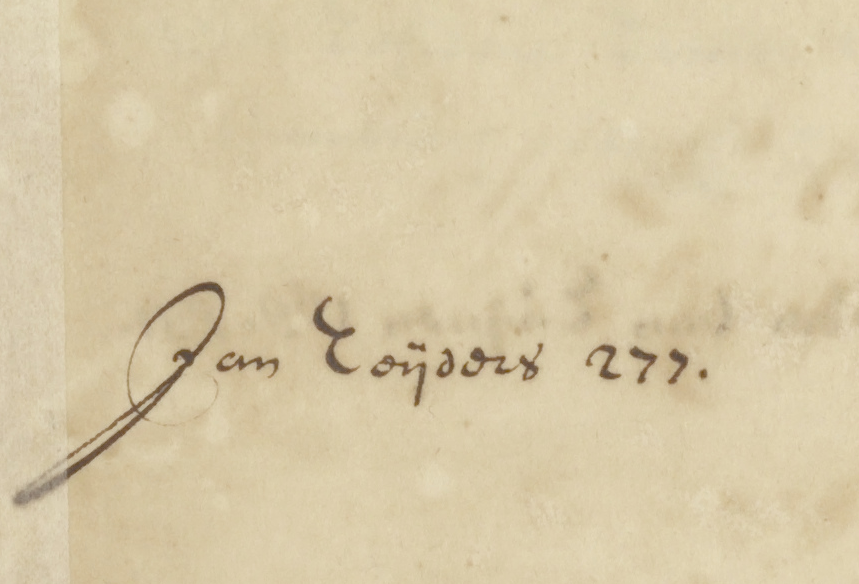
Jan Reijders 277.
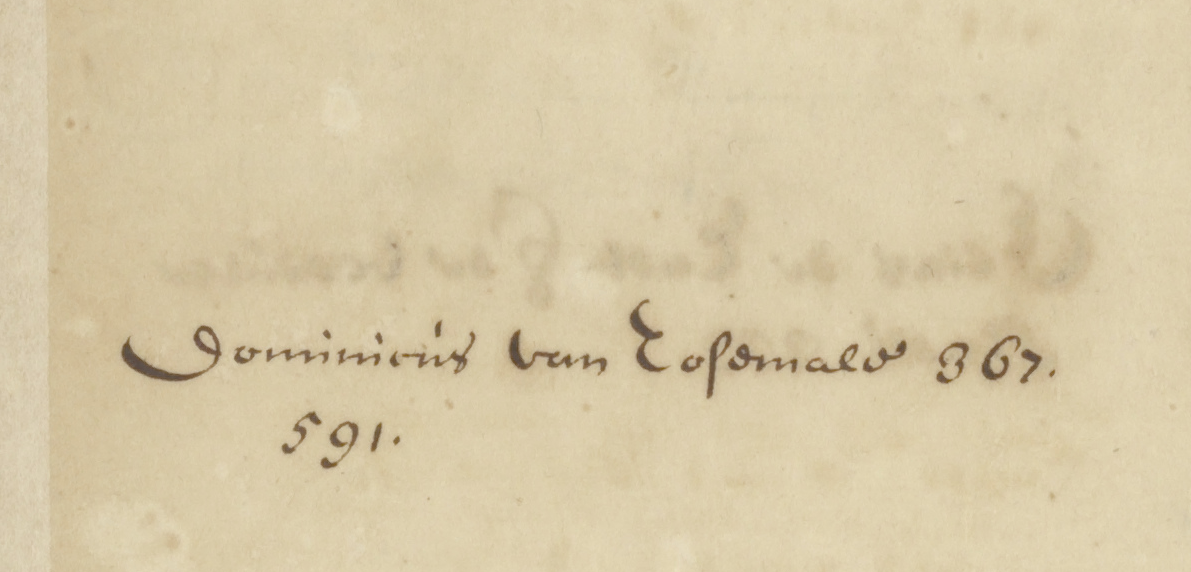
Dominicus van Rosemale 367.
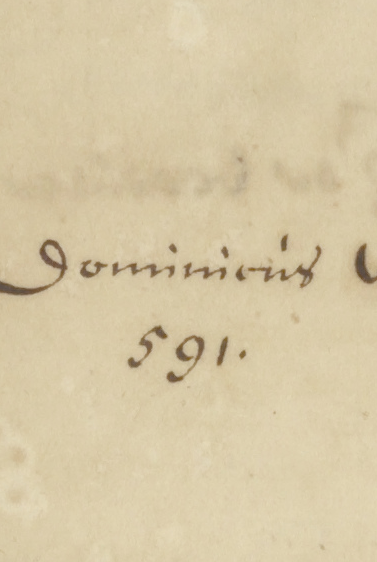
591.
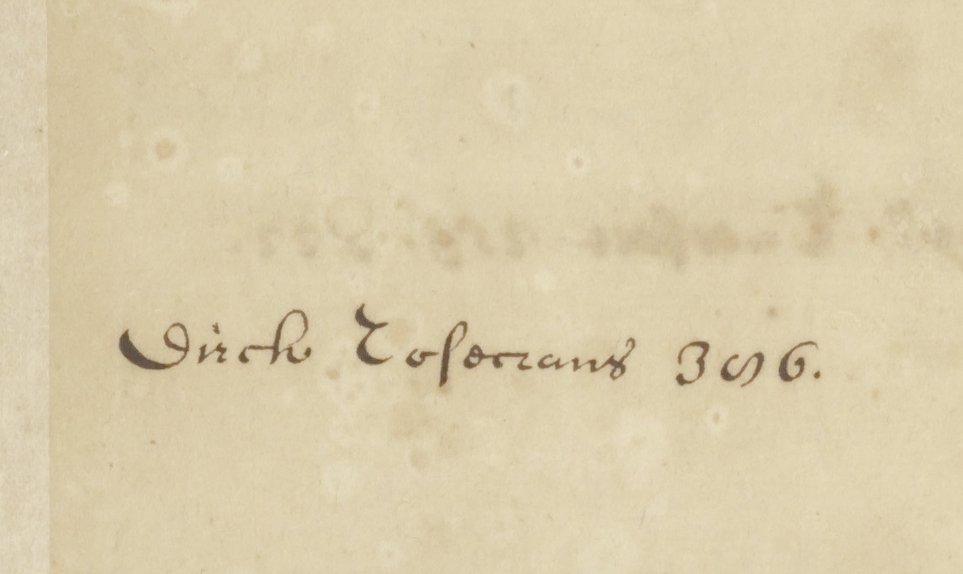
Dirck Rosecrans 386.
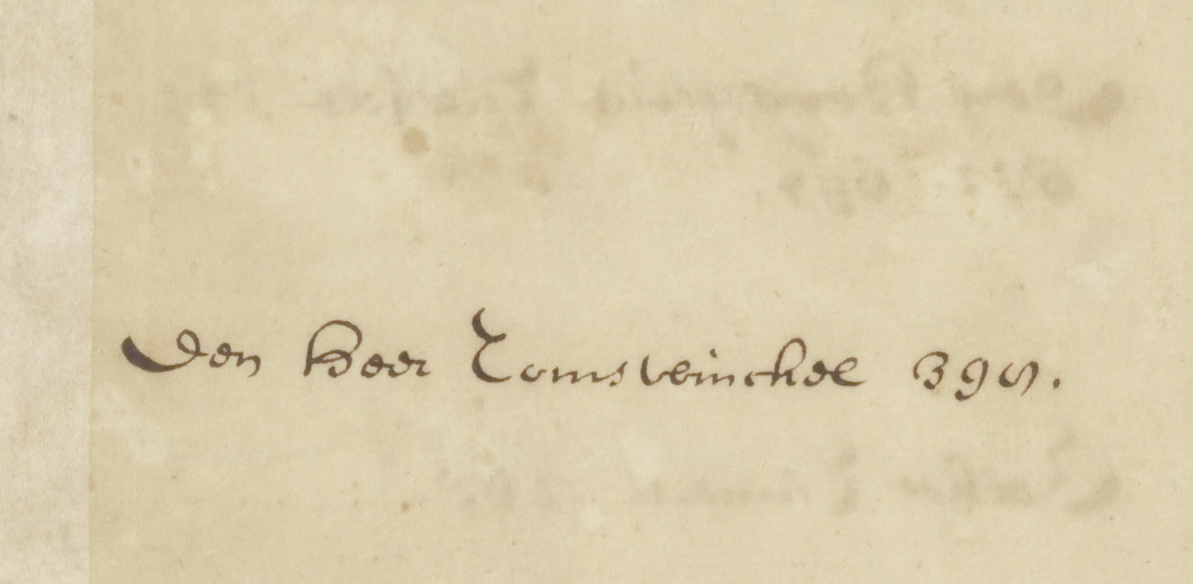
Den heer Romswinckel 398.
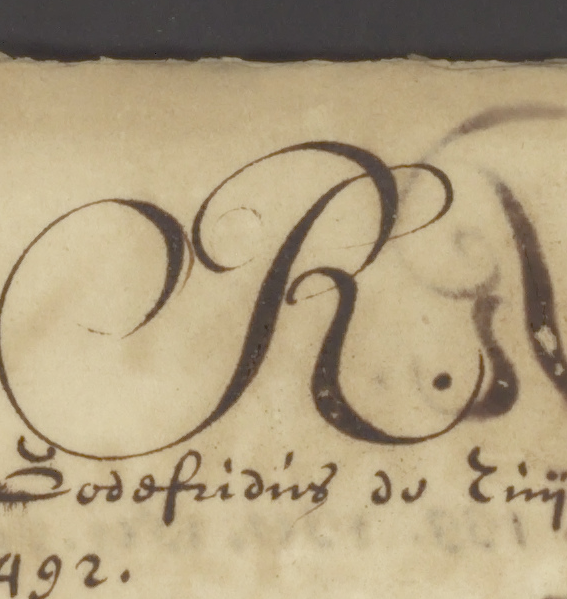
R.
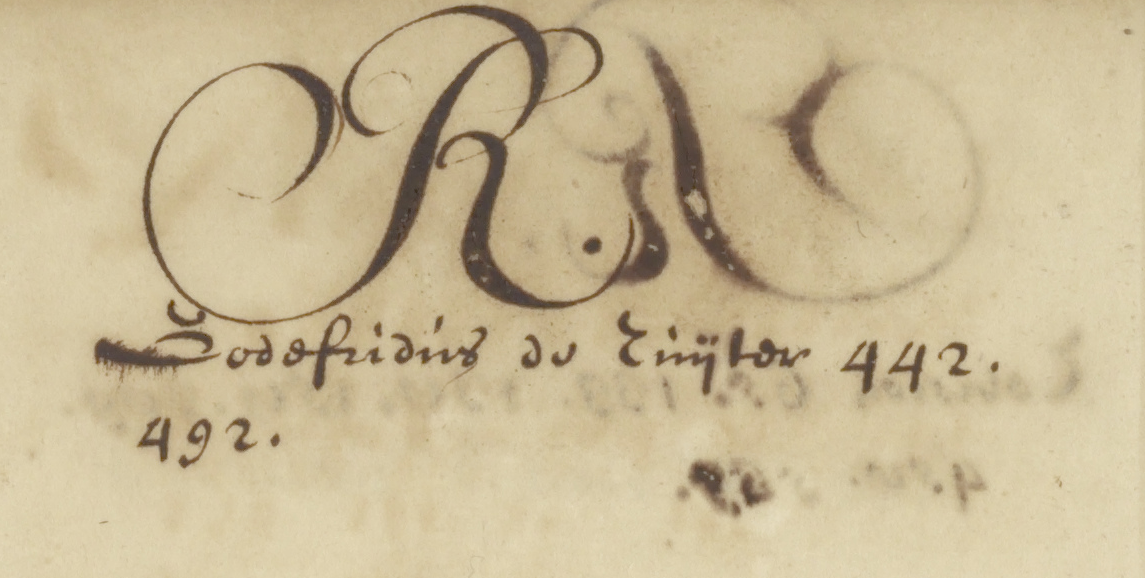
Godefridus de Ruijter 442.
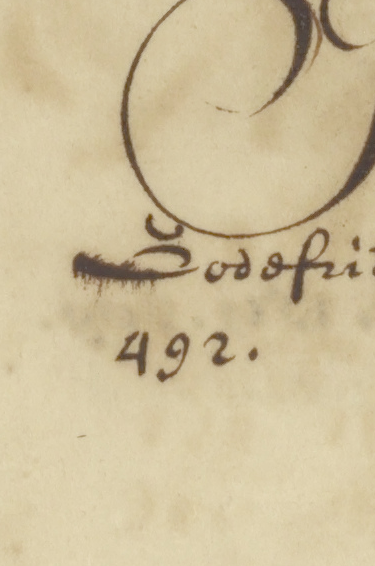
492.
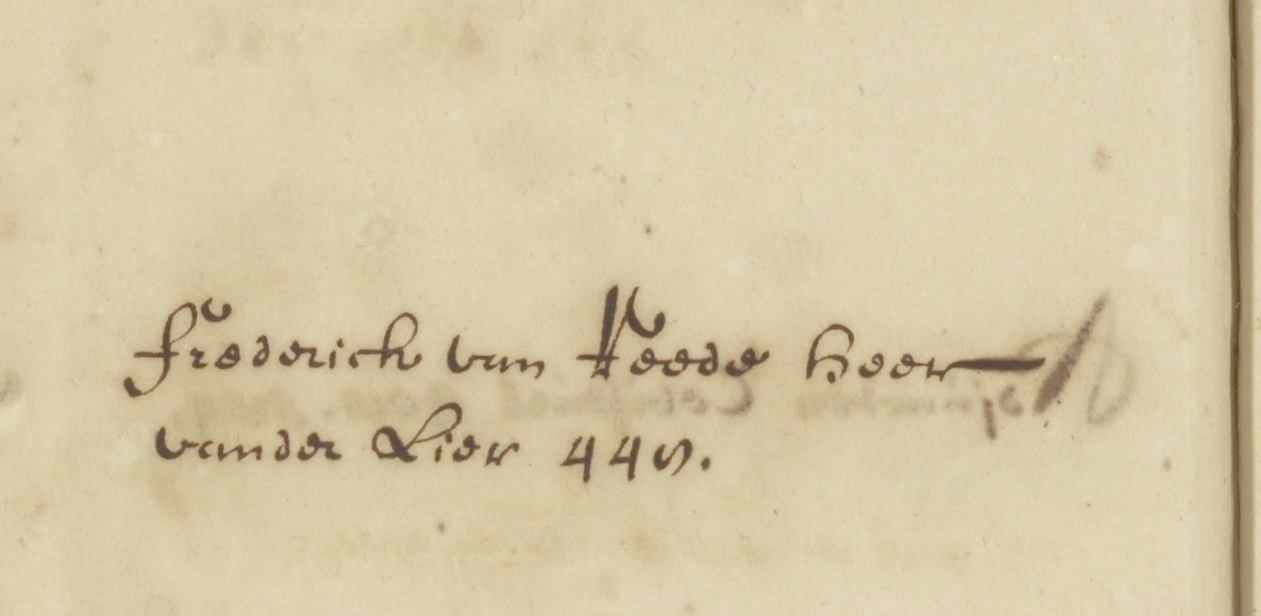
Frederick van Reede heer
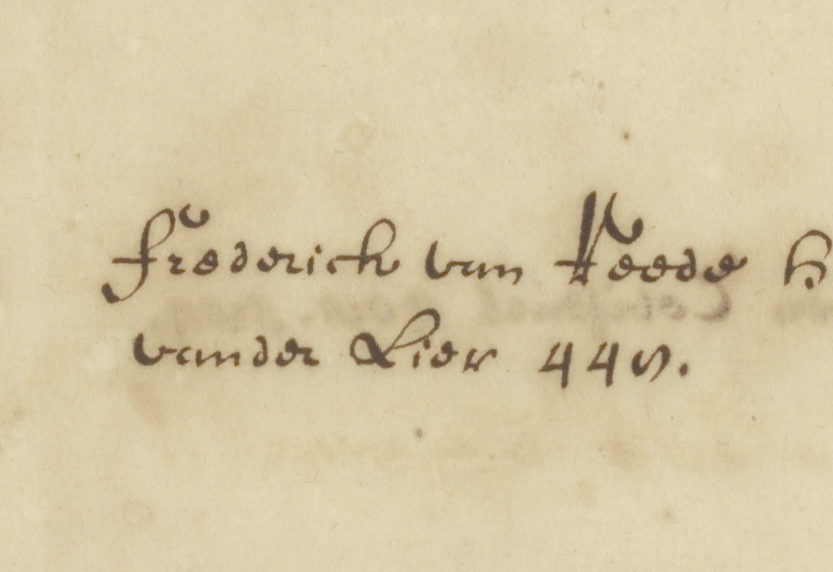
vander Lier 448.
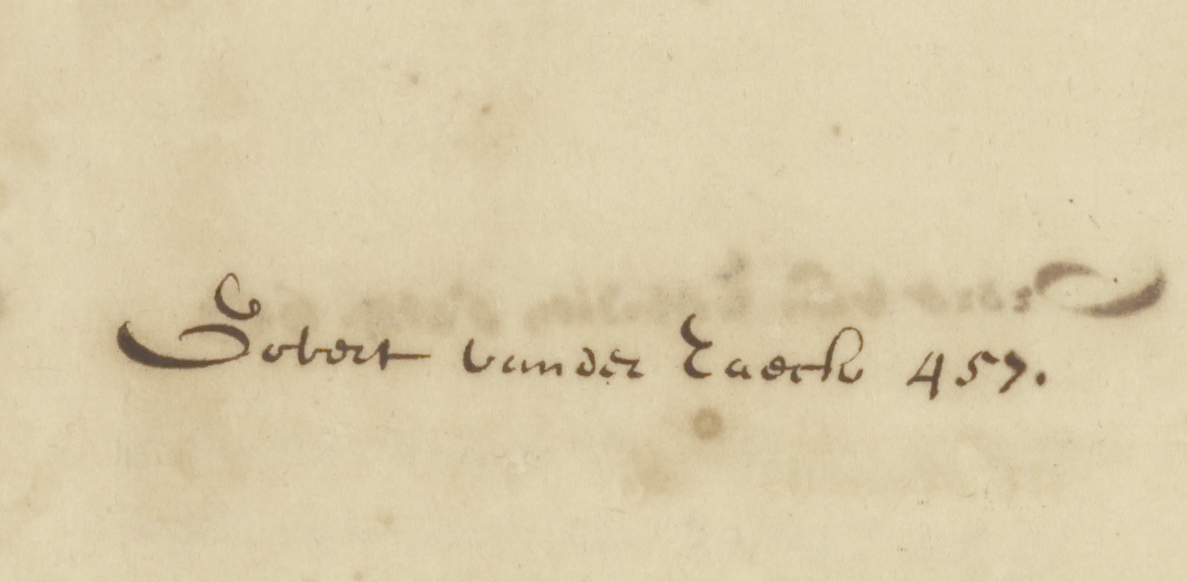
Govert vander Raeck 457.
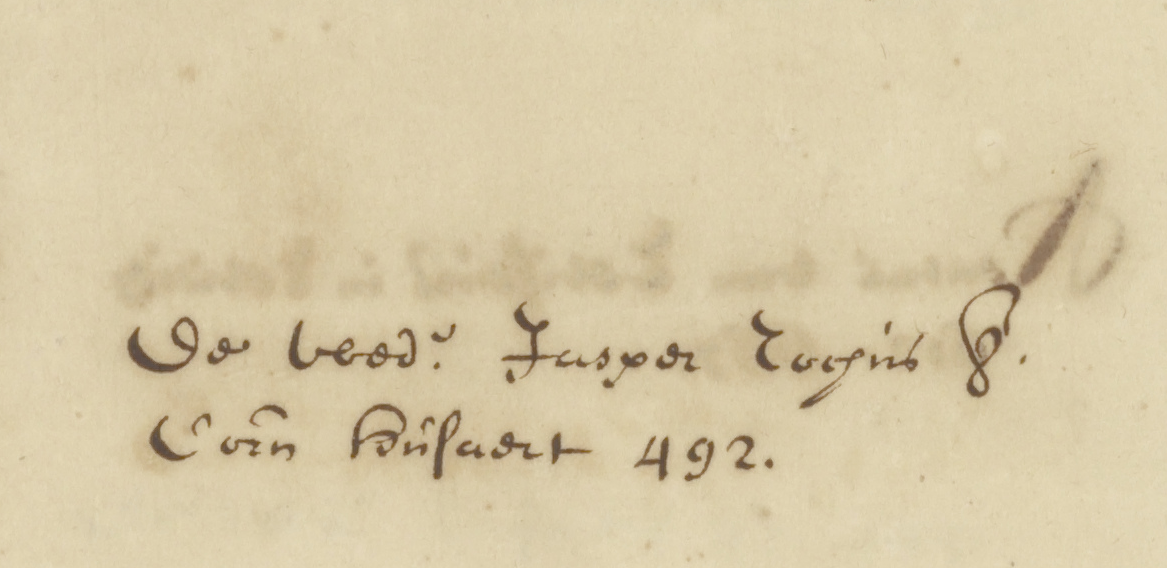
De wede. Jasper Rogus ca.
